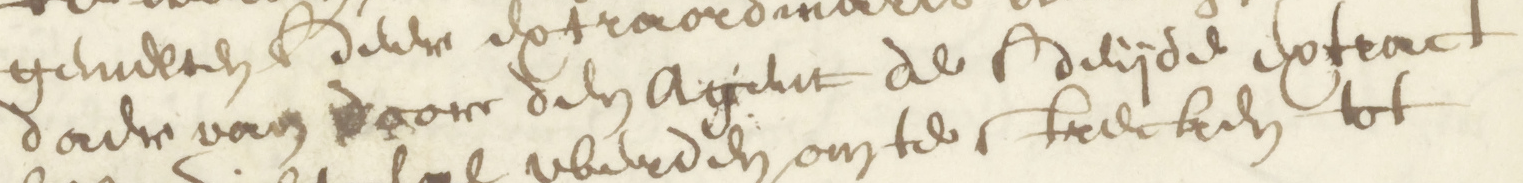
daer van door den Agent de Heijde extract
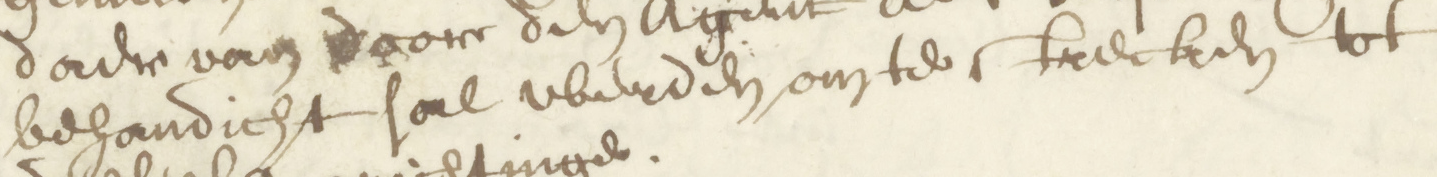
behandicht sal werden, om te strecken tot
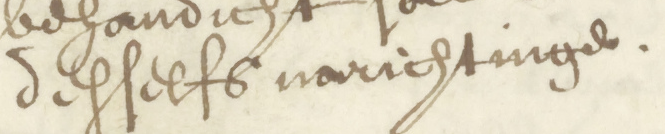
desselfs narichtinge.
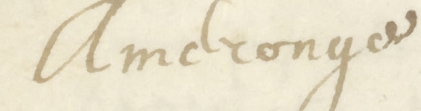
Ameronge
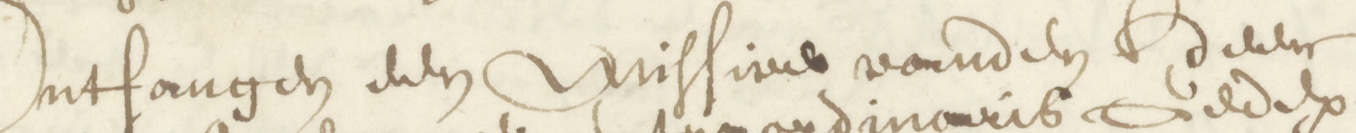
Ontfangen een missive vanden Heer
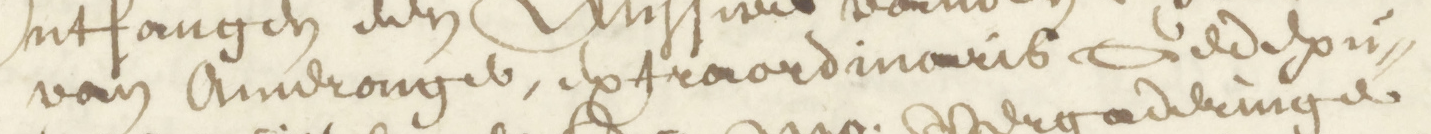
van Ameronge, extraordinaris Gedepu„
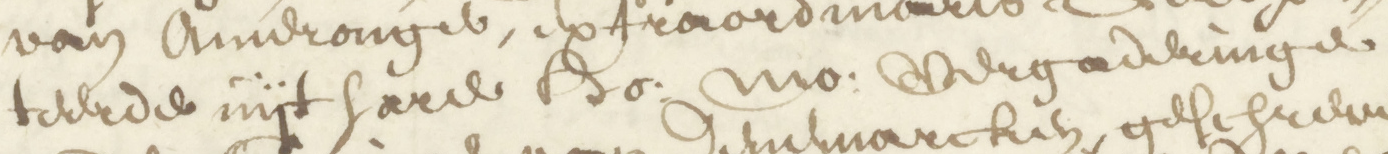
teerde uijt hare Ho:Mo: Vergaderinge
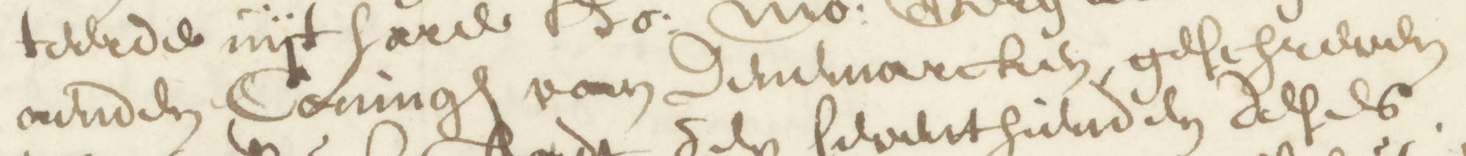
aenden Coningh van Denemarcken, geschreven
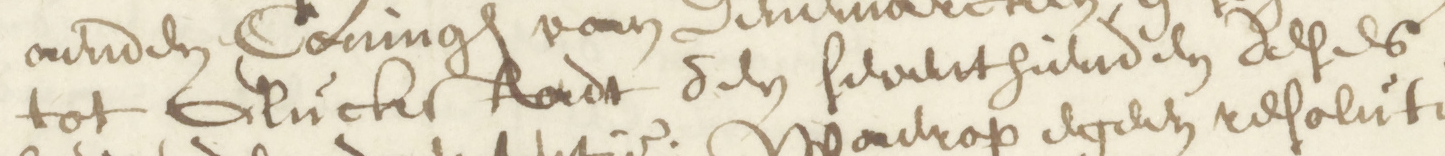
tot Gluckstadt den seventhienden deses
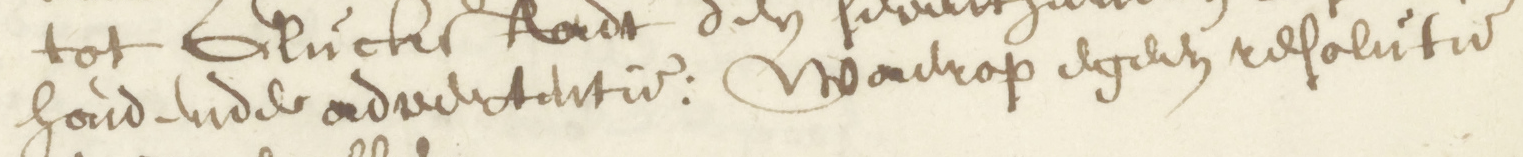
houdende advertentie: Waerop egeen resolutie
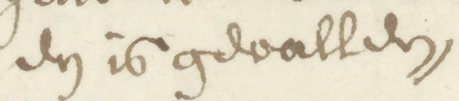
en is gevallen.
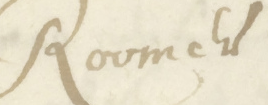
Roomer
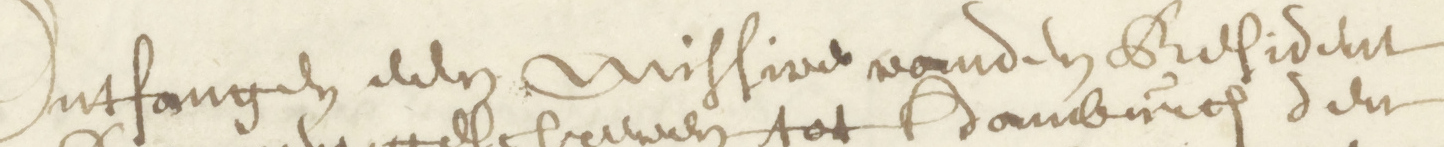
Ontfangen een missive vanden Resident
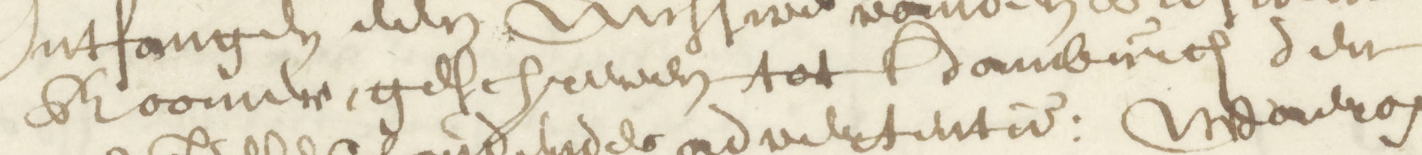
Roomer, geschreven tot Hamburch den
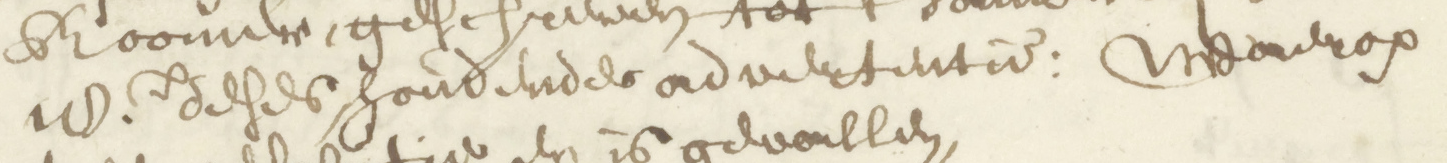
18e. deses, houdende advertentie: Waerop
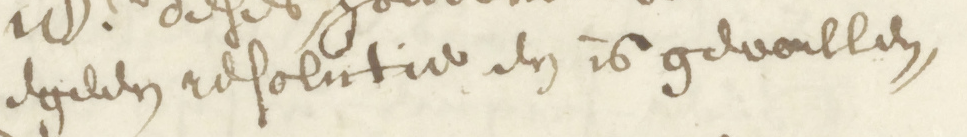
egeen resolutie is gevallen.
